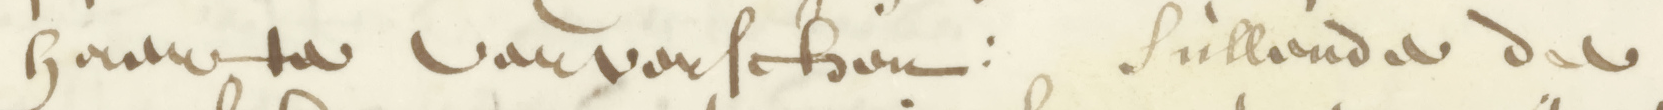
haer te ververschen: Sullende de
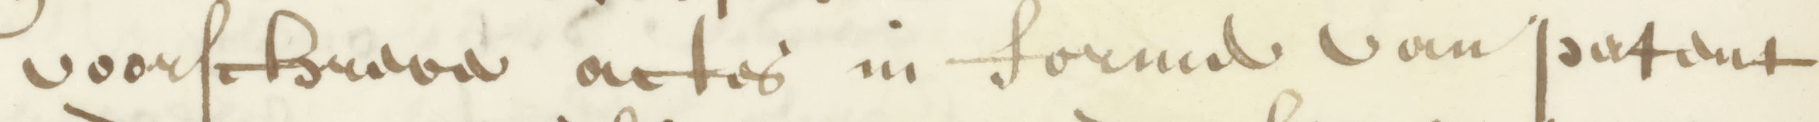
voorschreve actes in forme van patent
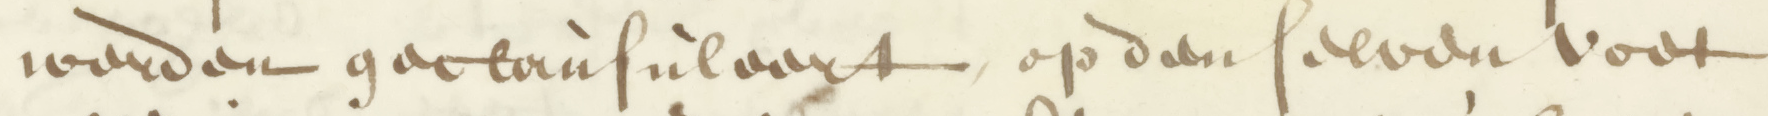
worden geclausuleert, op den selven voet
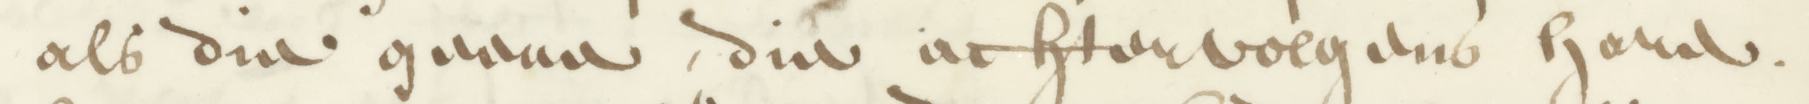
als die geene, die achtervolgens hare
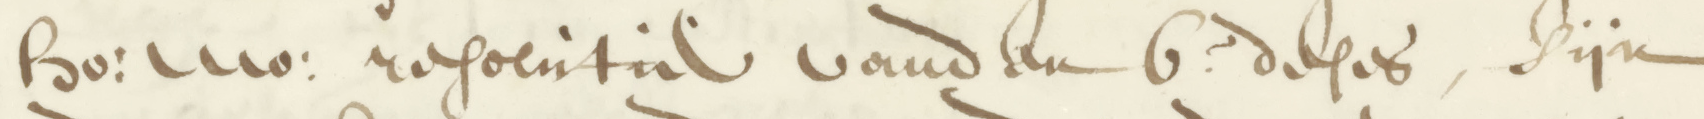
Ho: Mo: resolutie vanden 6e. deses sijn
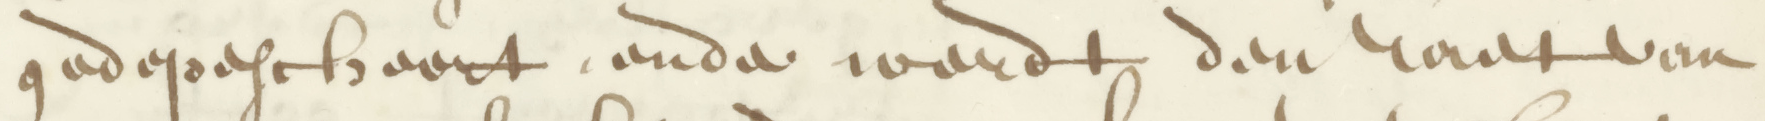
gedepescheert, ende werdt den raet van
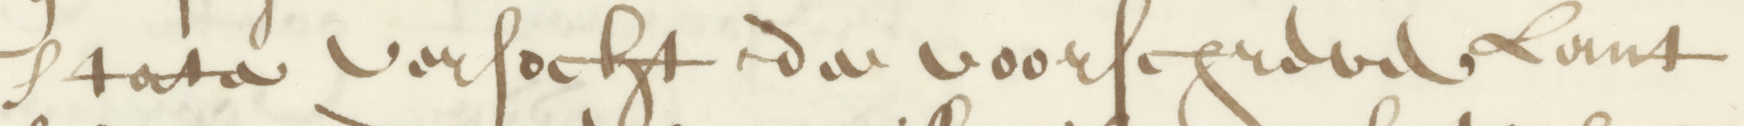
State versocht de voorschreve Lant
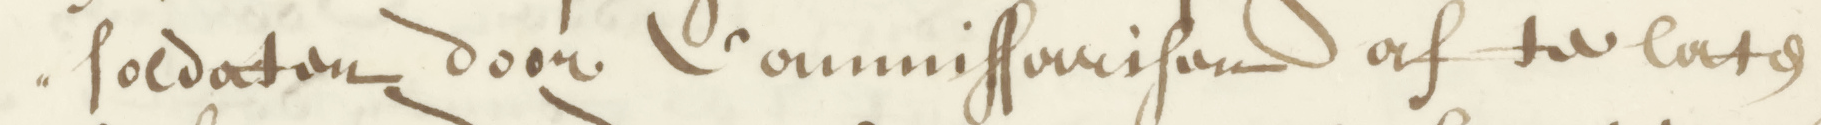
soldaten door Commissarisen af te laten
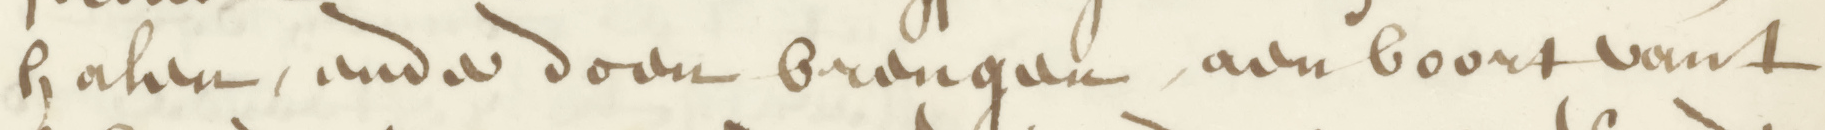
halen, ende doen brengen, aen boort vant
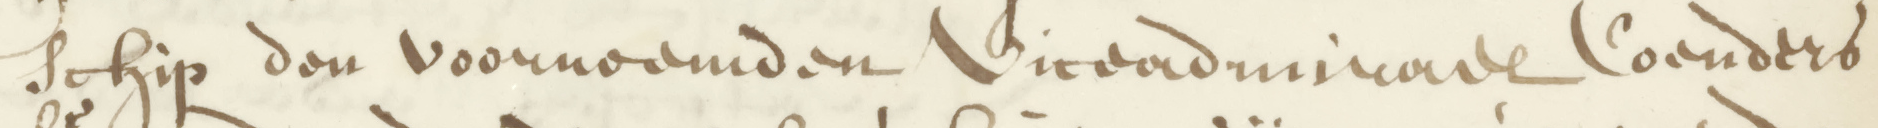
schip den voornoemden Viceadmirael Coenders
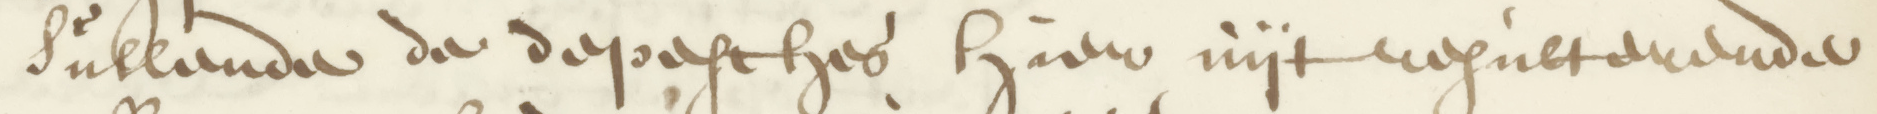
sullende de depesches hier uijt resulterende
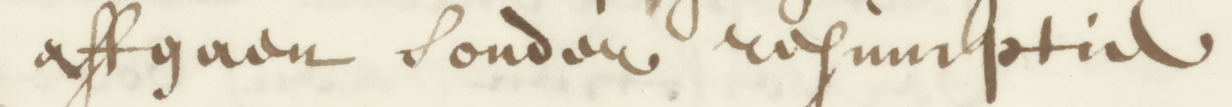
affgaen sonder resumptie.
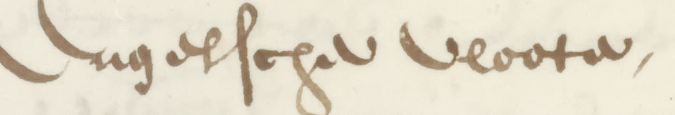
Engelsche vloote
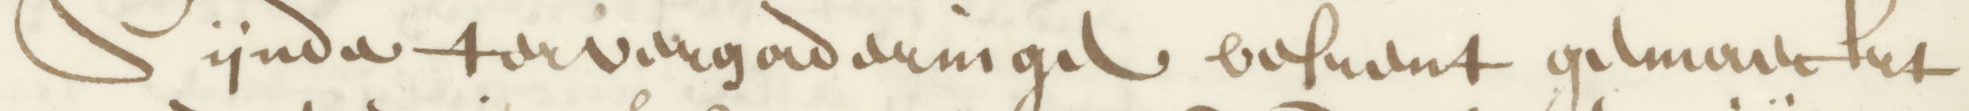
Sijnde ter vergaderinge bekent gemaeckt
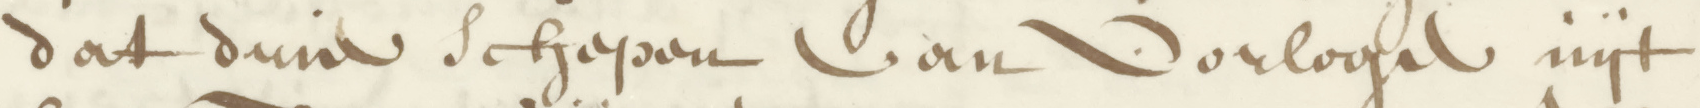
dat drie schepen van Oorloge uijt
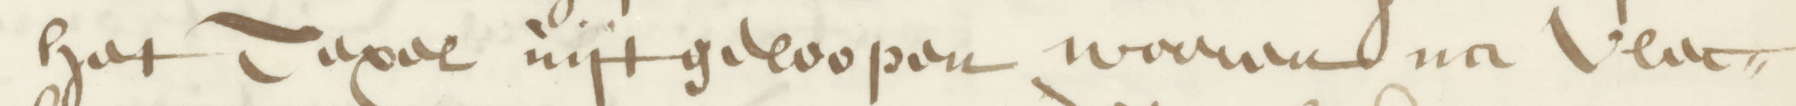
het Texel uijt geloopen waren na Vlec„
